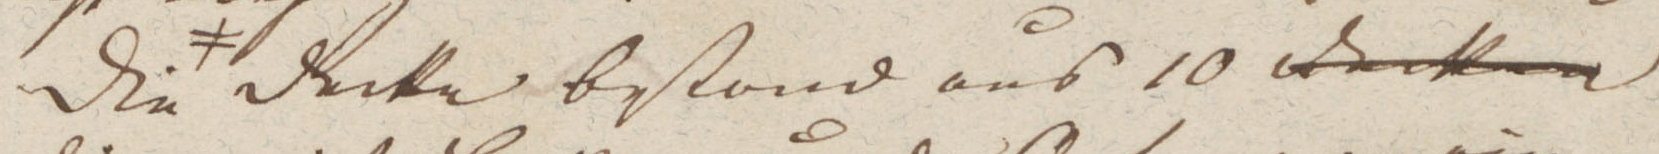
Die % Decke bestand aus 10 Decken
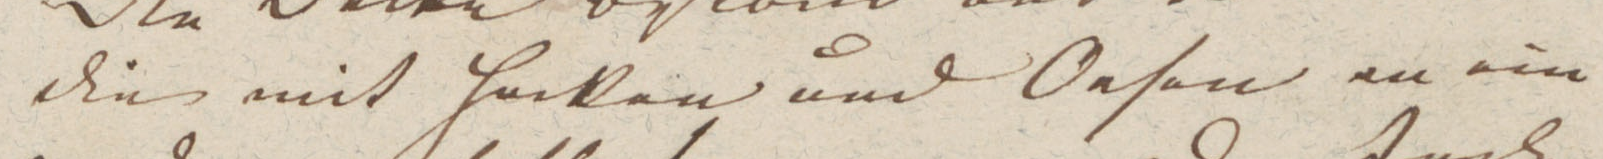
die mit Haken und Oesen an ein-
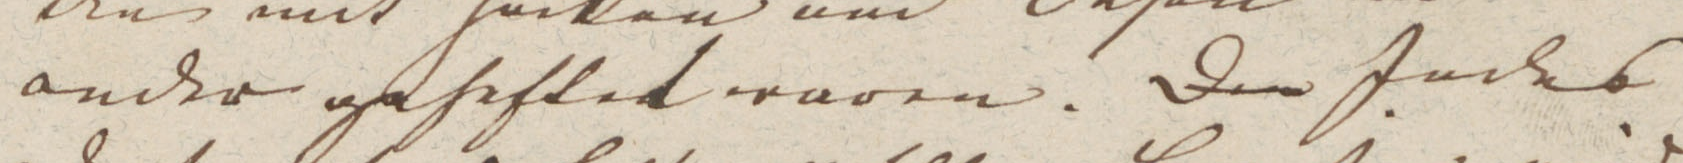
ander geheftet waren. Die Jedes
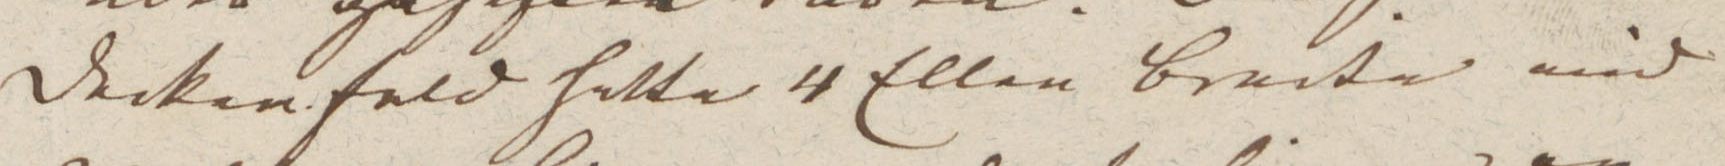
Deckenfeld hatte 4 Ellen Breite und
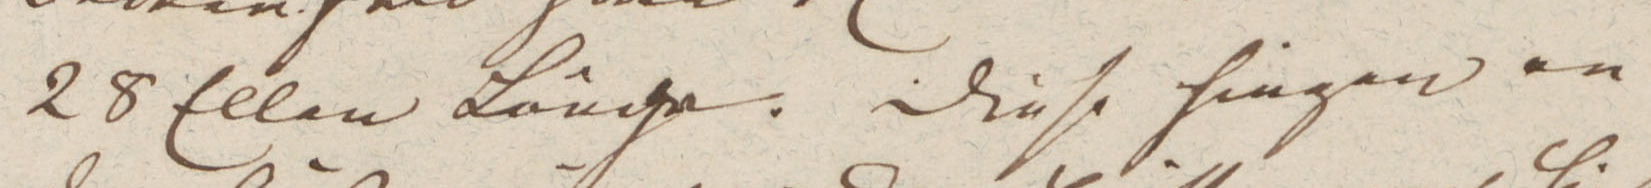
28 Ellen Länge. Diese hingen an
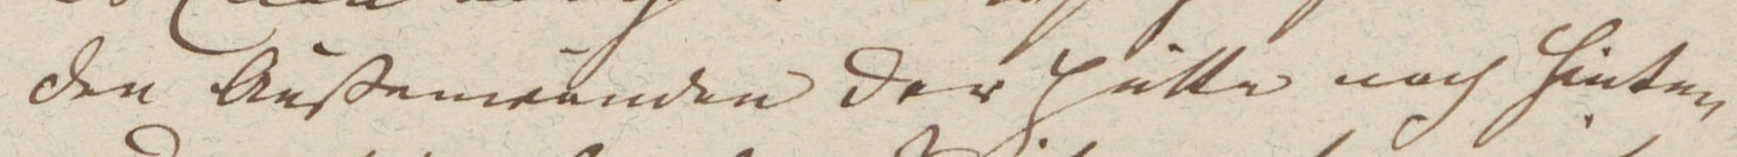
den Aussenwänden der Hütte nach Hinten
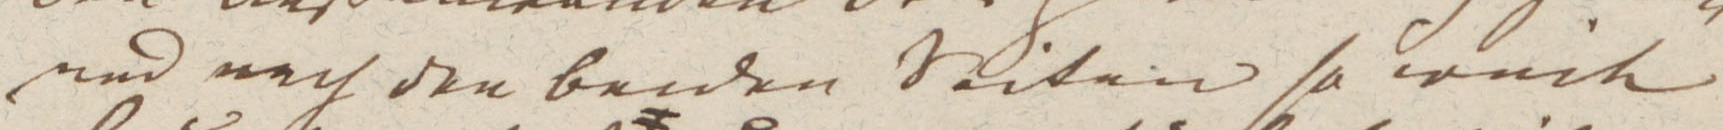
und nach den beiden Seiten so weit
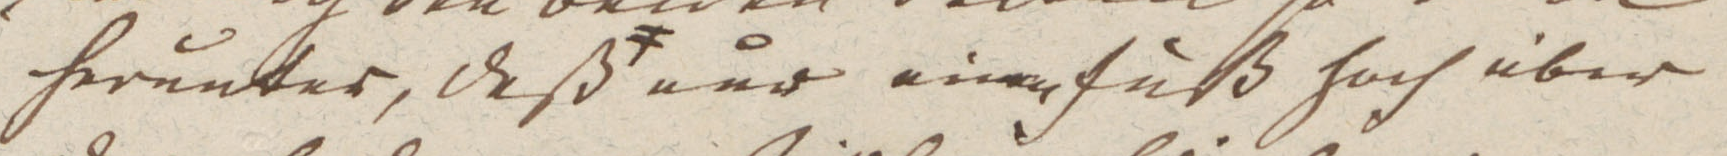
herunter, dass % nur einen Fuss hoch über
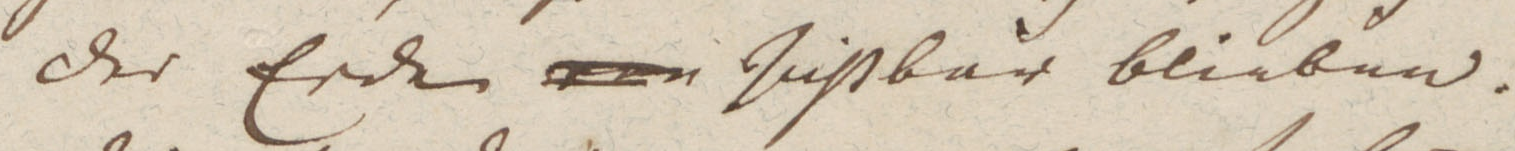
der Erde von sichtbar blieben.
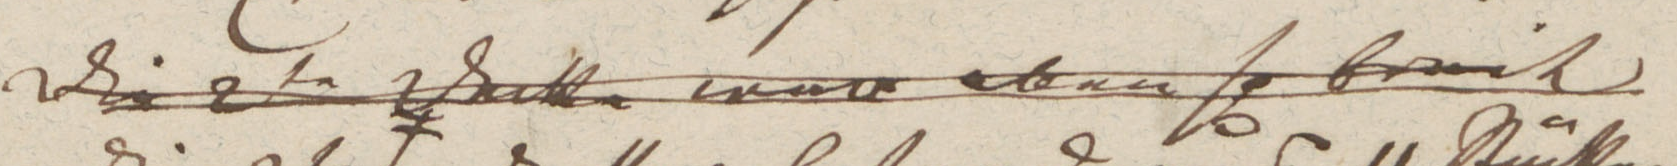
Die 2te Decke war eben so breit
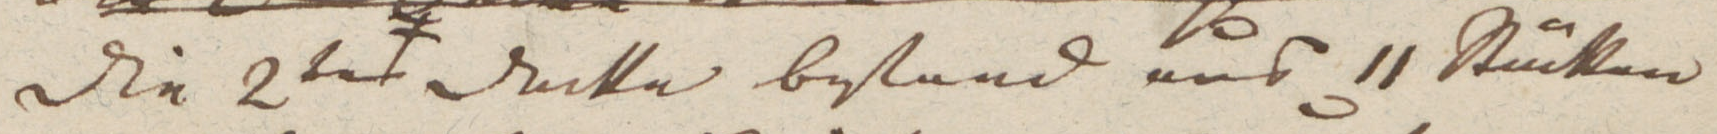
Die 2te % Decke bestand aus 11 Stücken
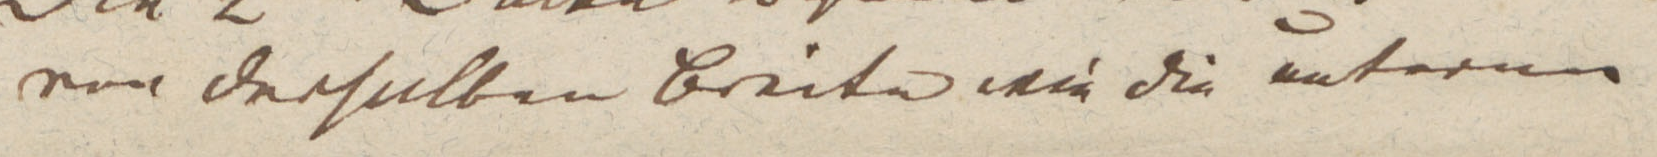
von derselben Breite wie die unteren
